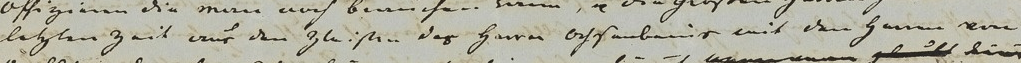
letzten Zeit aus dem Zwisten des Herrn Ochsenbeins mit dem Herrn von
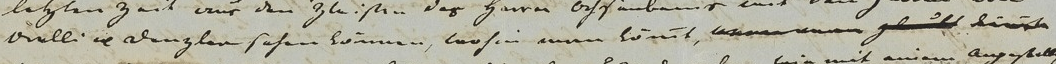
Orelli u Denzler sehen können, wohin man kömmt, wenn man glaubt könnte
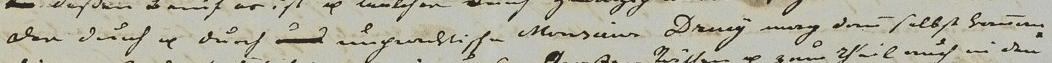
Der durch u durch ... unpraktischen Monsieur Druey mag dann selbst komman-
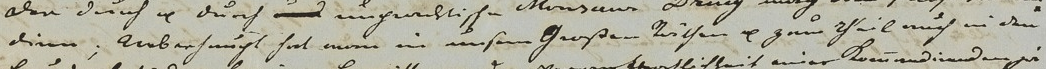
dieren; Ueberhaupt hat man in unsern Großen Räthen u zum Theil auch in den
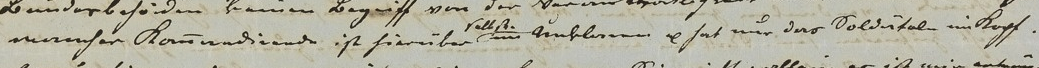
mancher Kommandierende ist hierüber selber im Unklaren u hat nur das Soldäteln im Kopf.
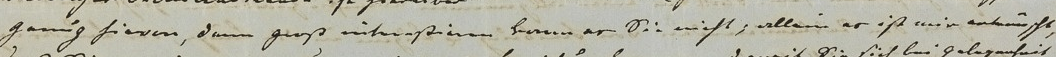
Genug hiervon, denn groß intereßieren kann es Sie nicht; allein es ist mir erwünscht,
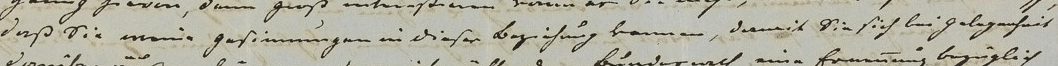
daß Sie meine Gesinnungen in dieser Beziehung kennen, damit Sie sich bei Gelegenheit
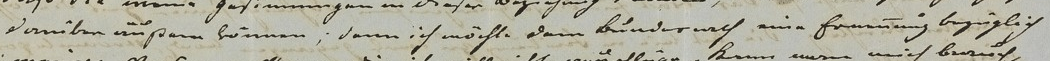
darüber äußern können; denn ich möchte dem Bundesrath eine Ernennung bezüglich
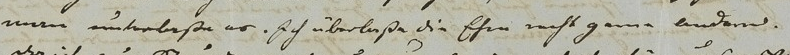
man unterlaße es. Ich überlaße die Ehre recht gerne Andern. –
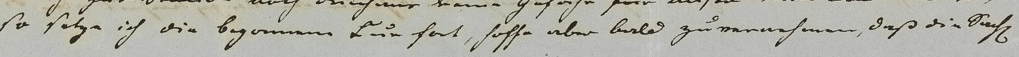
so setze ich die begonnene Cur fort, hoffe aber bald zu vernehmen, daß die Sachen
